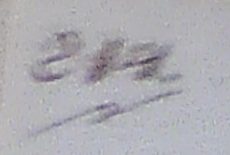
214.
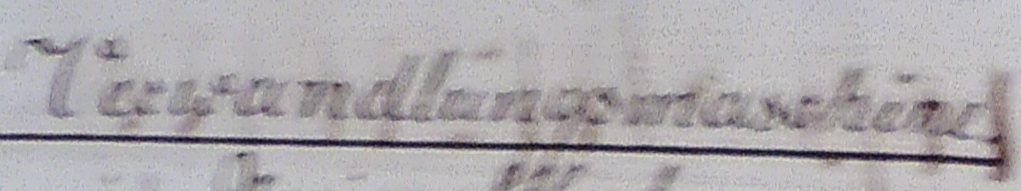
Verwandlungsmaschine
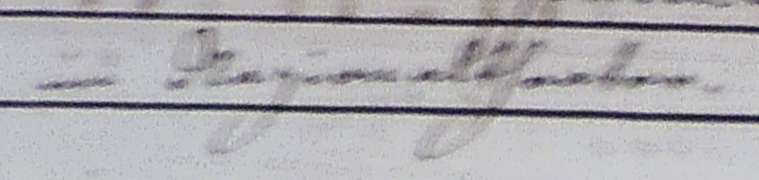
im Nazionaltheater.
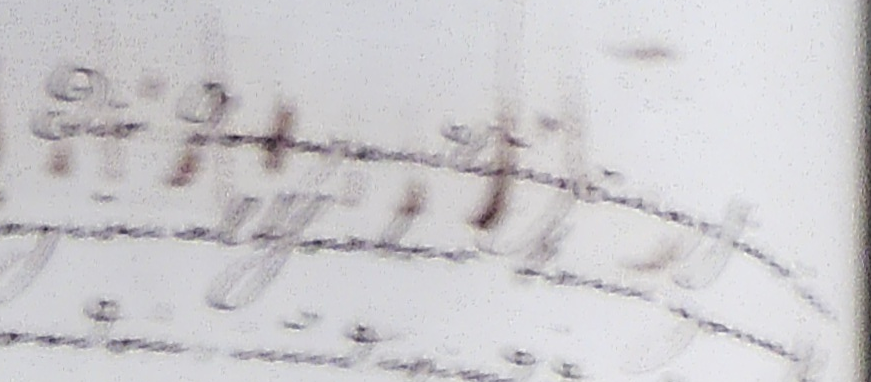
Die Verwandlungsmaschine im
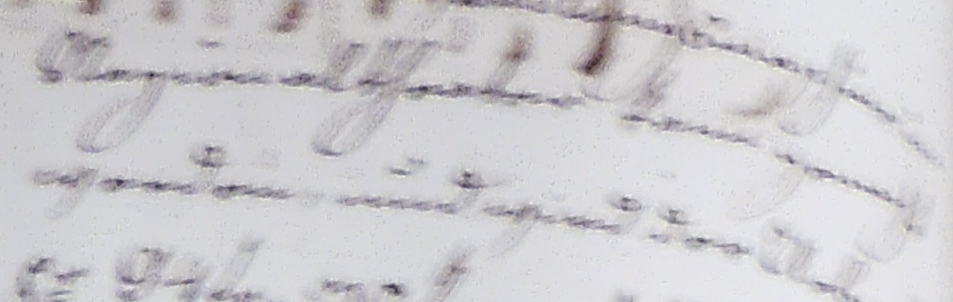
Nazionaltheater kann gemacht
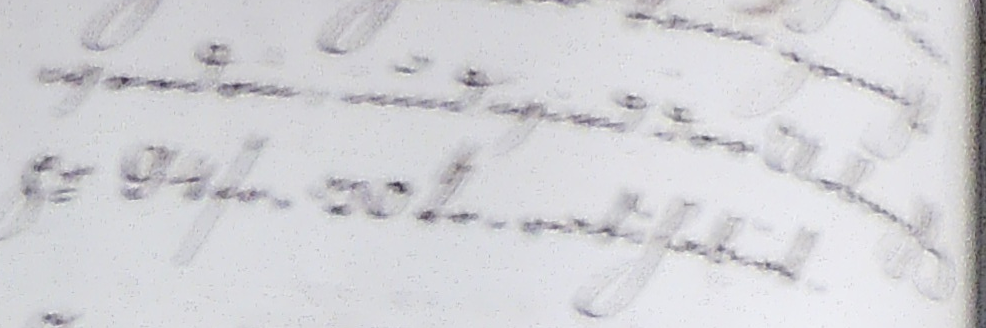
werden, und wird der Ueberschlag
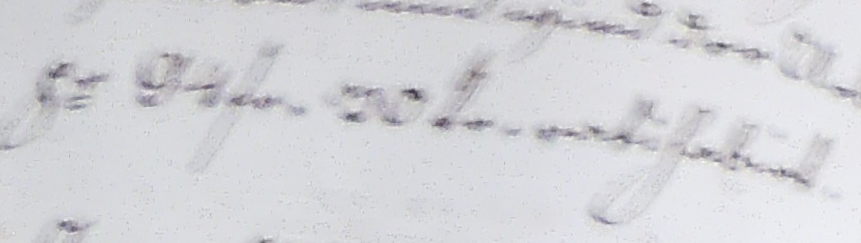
pr͇ 94fr. 30kr. ratihabirt.
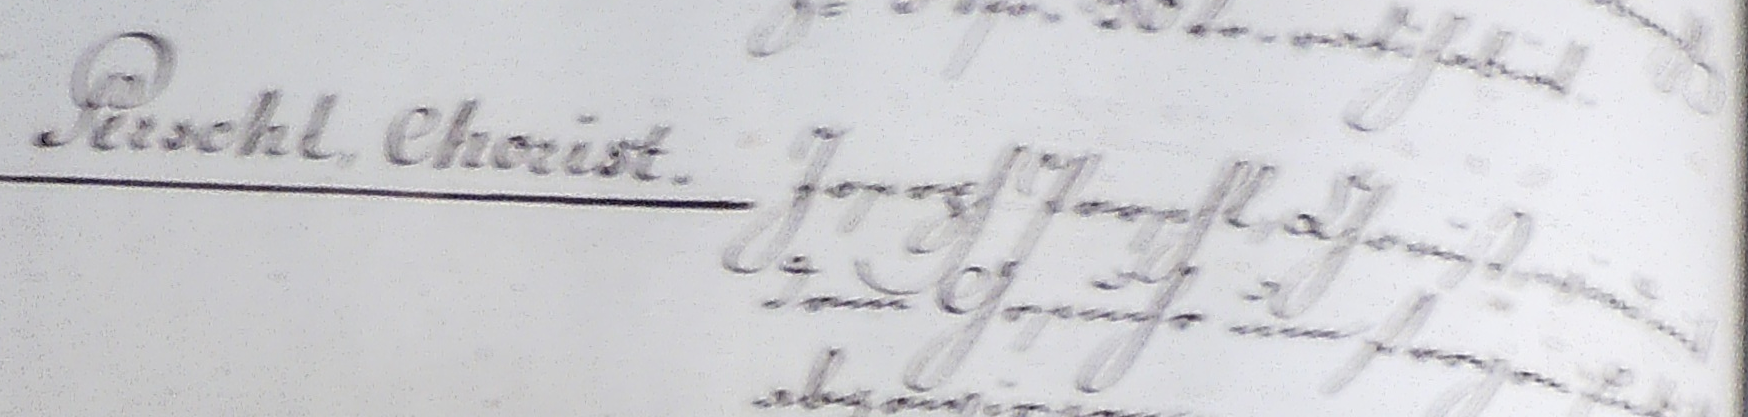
Perschl, Chorist. Joseph Perschl, Chorist wird mit
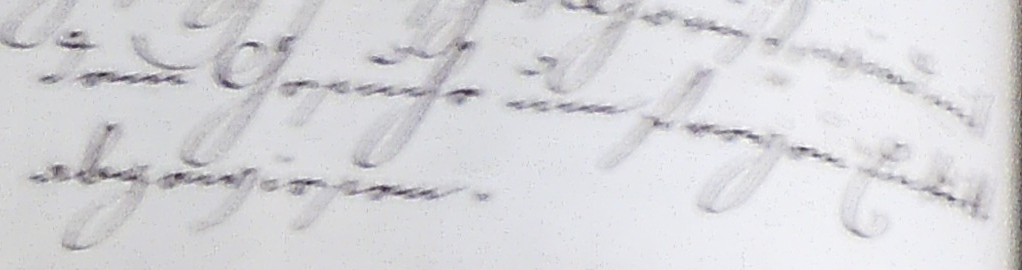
dem Gesuche um freyen Eintritt
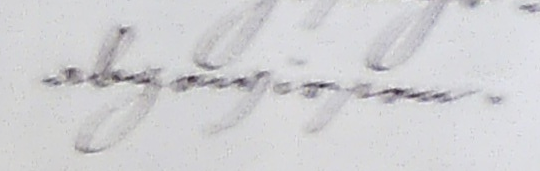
abgewiesen.
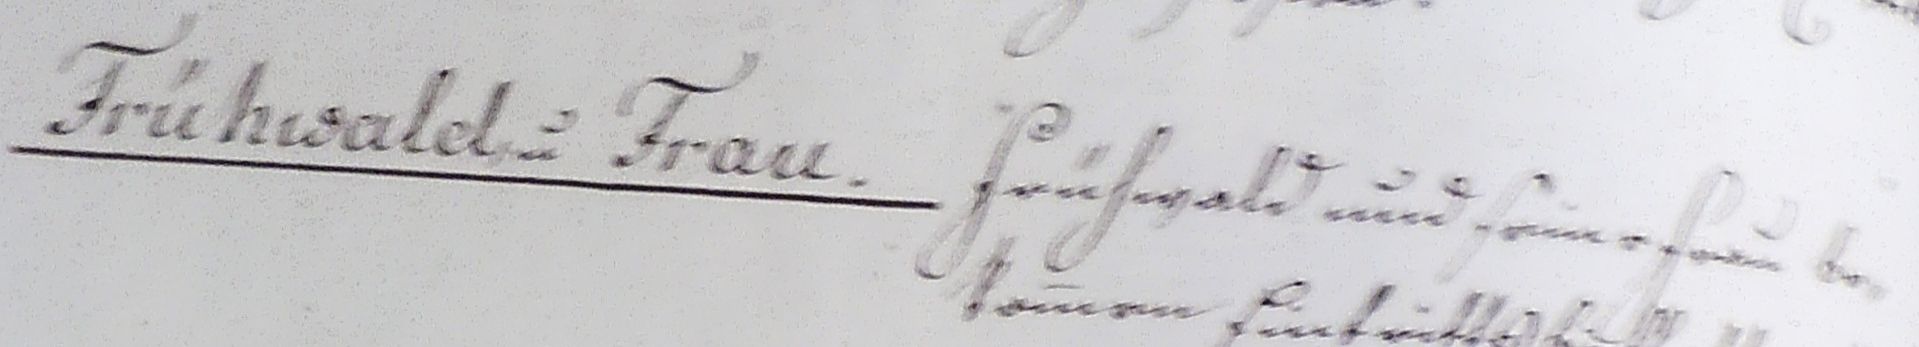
Frühwald u Frau. Frühwald und seine Frau be
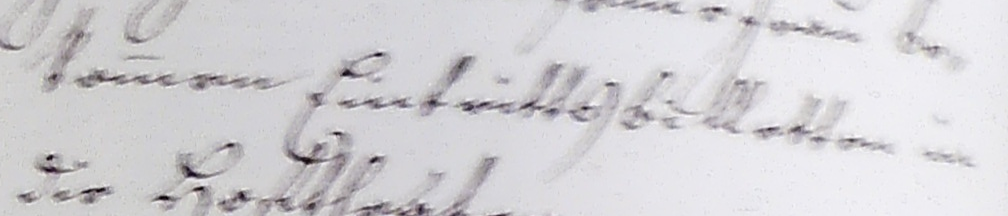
kom̅en Eintrittsbilletten in
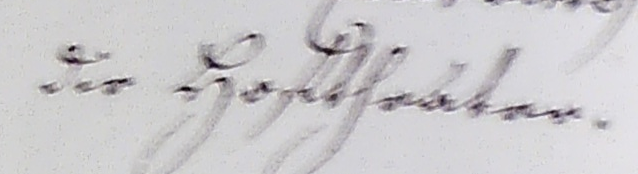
die Hofheater.
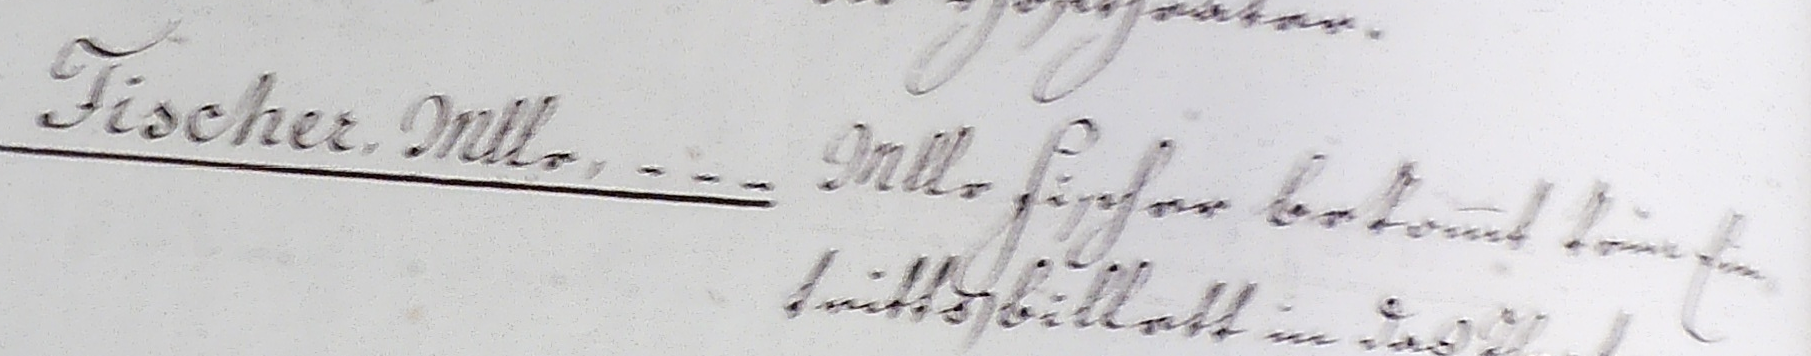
Fischer, Mlle, .. .. .. Mlle Fischer bekom̅t keine Ein¬
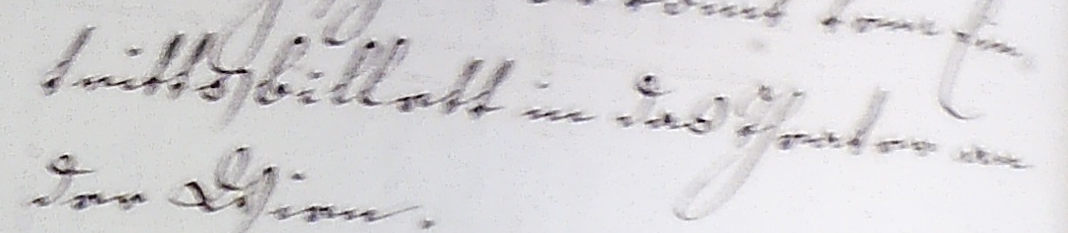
trittsbillett in das Theater an
